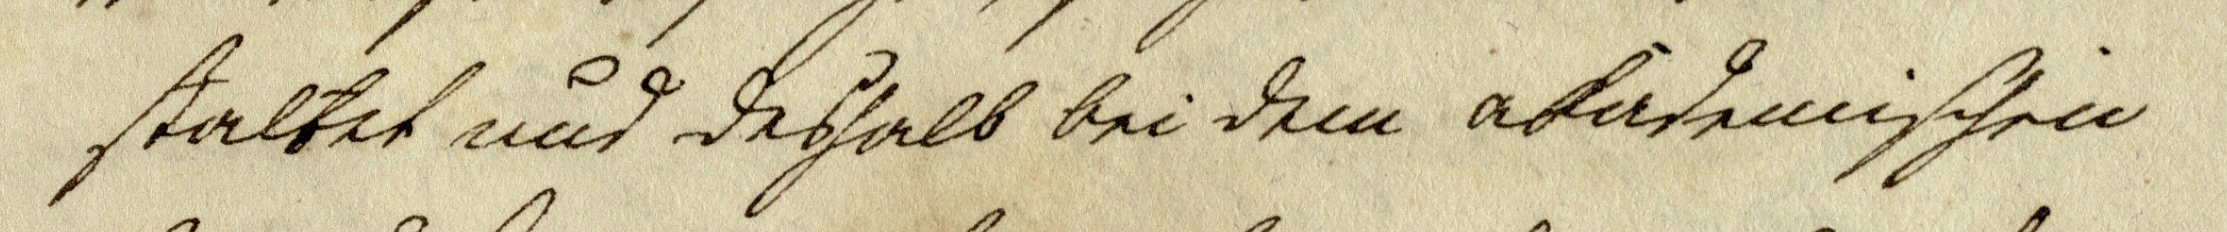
staltet und deshalb bei dem akademischen
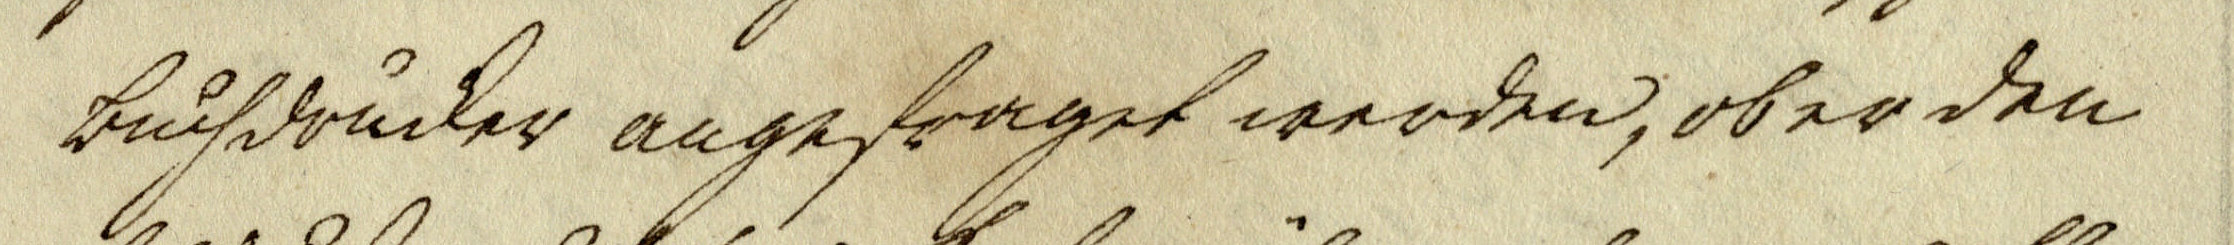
Buchdrucker angefraget werden, ob er den
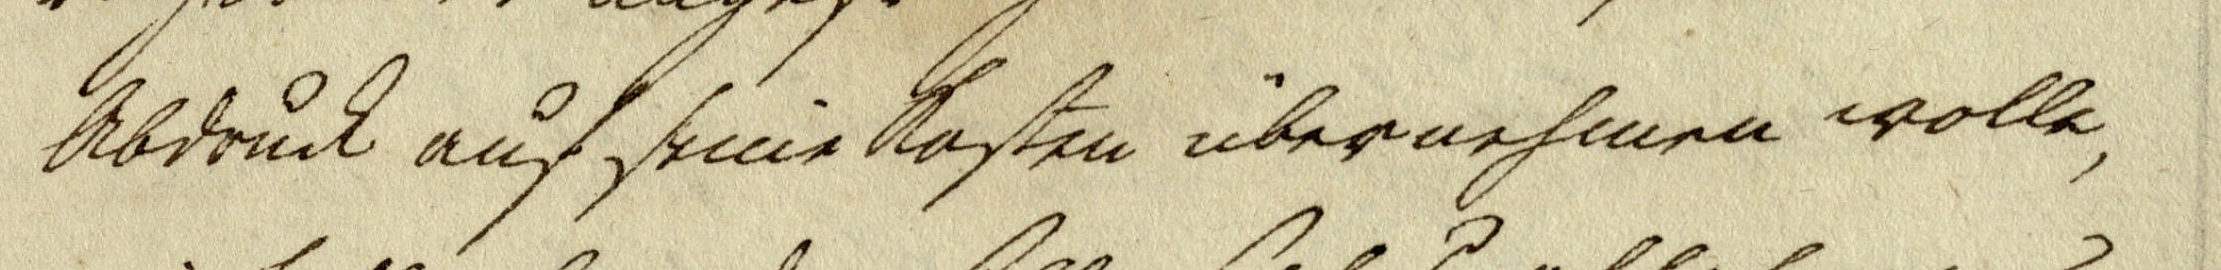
Abdruck auf seine Kosten übernehmen wolle,
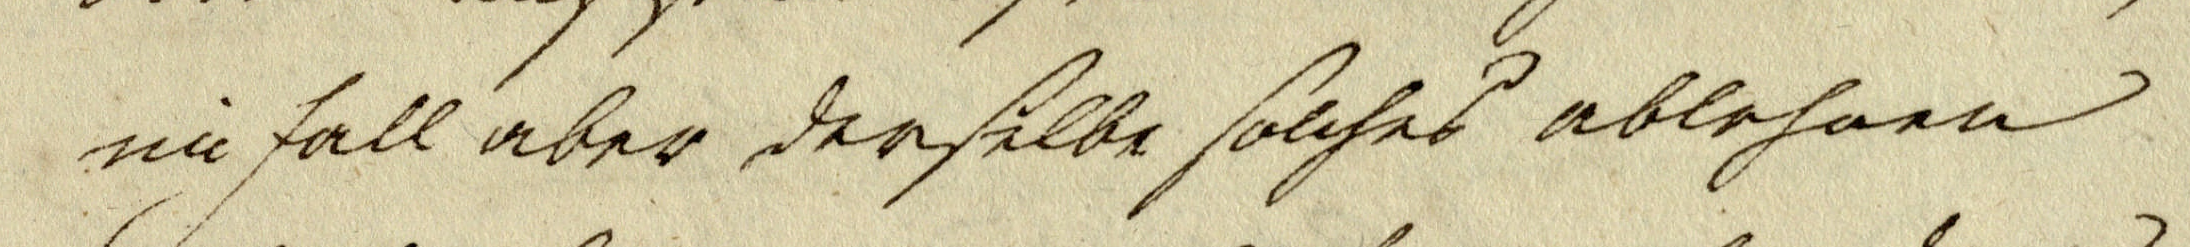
im Fall aber derselbe solches ablehnen
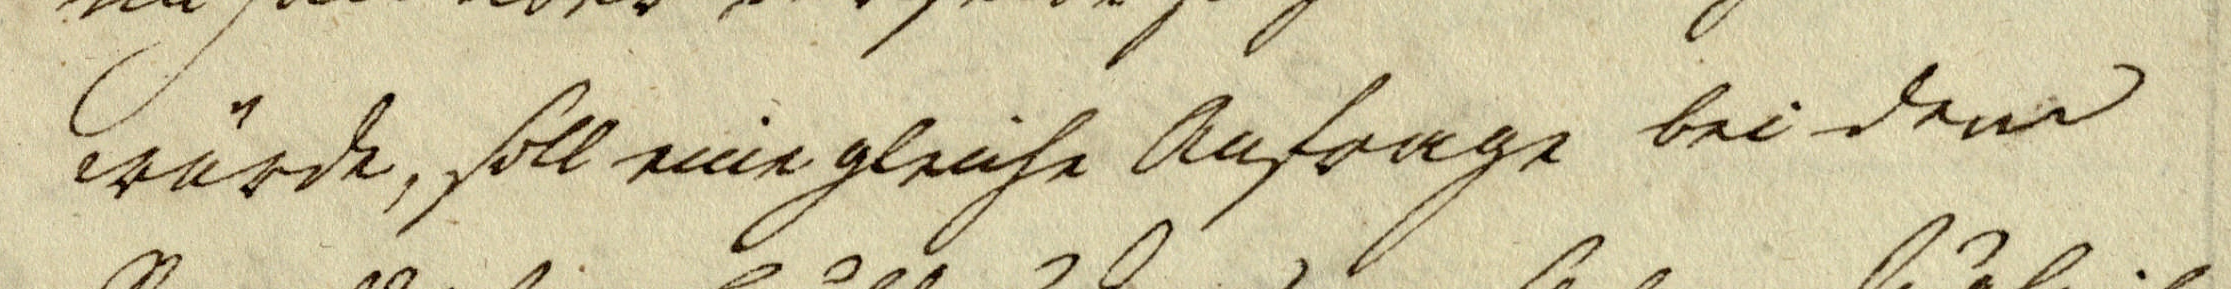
würde, soll eine gleiche Anfrage bei dem
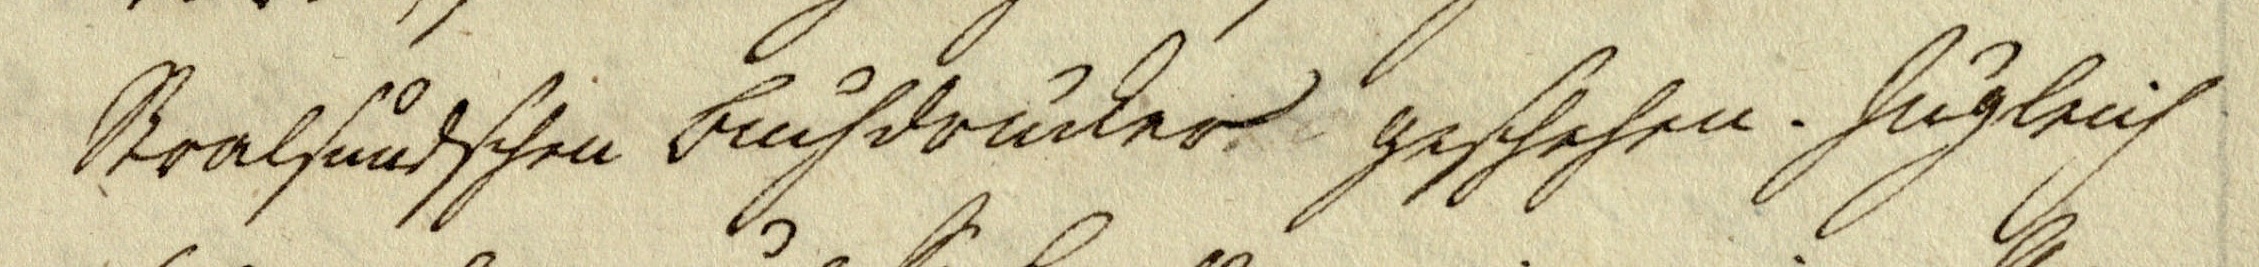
Stralsundschen Buchdrucker geschehen. Zugleich
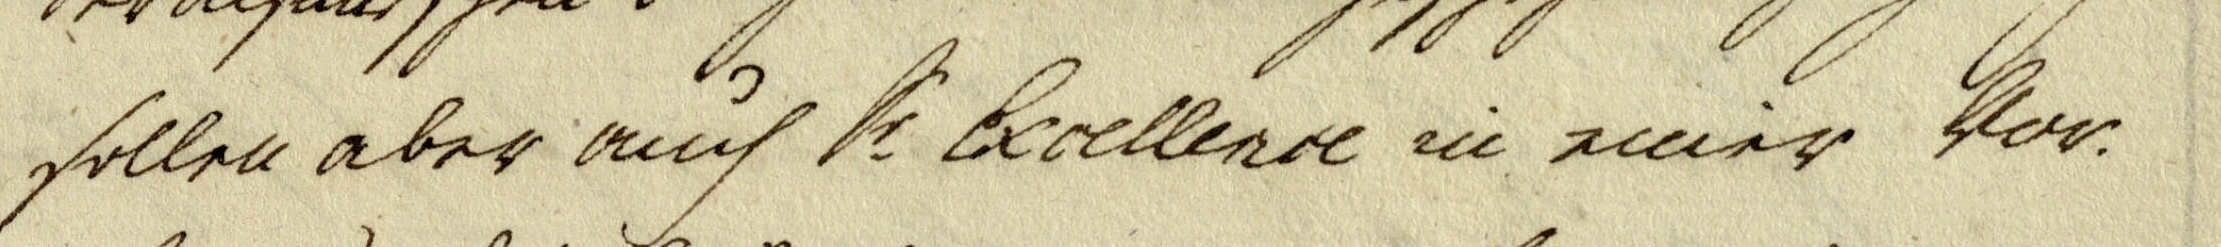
sollen aber auch Sr Excellence in einer Vor¬
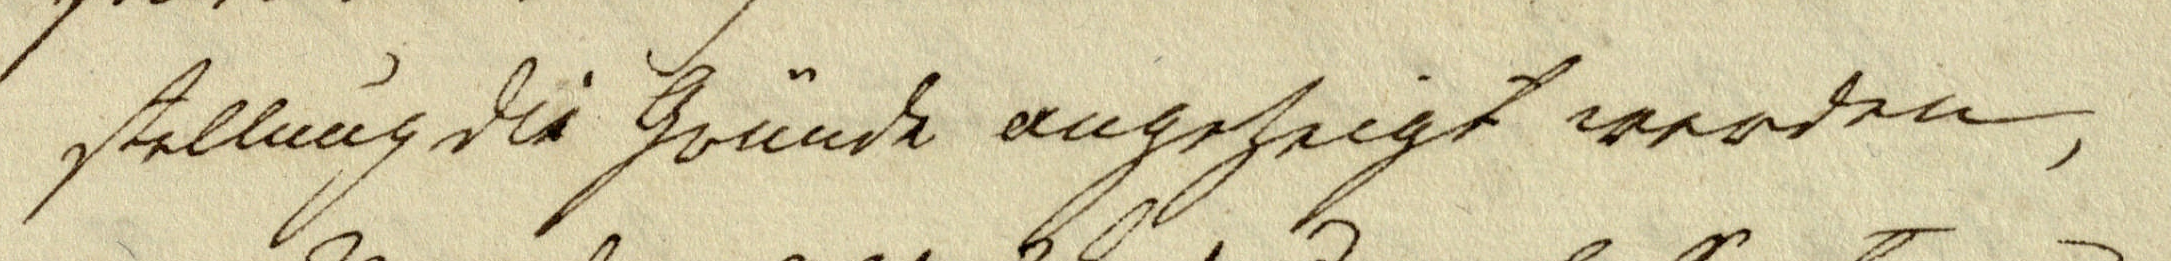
stellung die Gründe angezeigt werden,
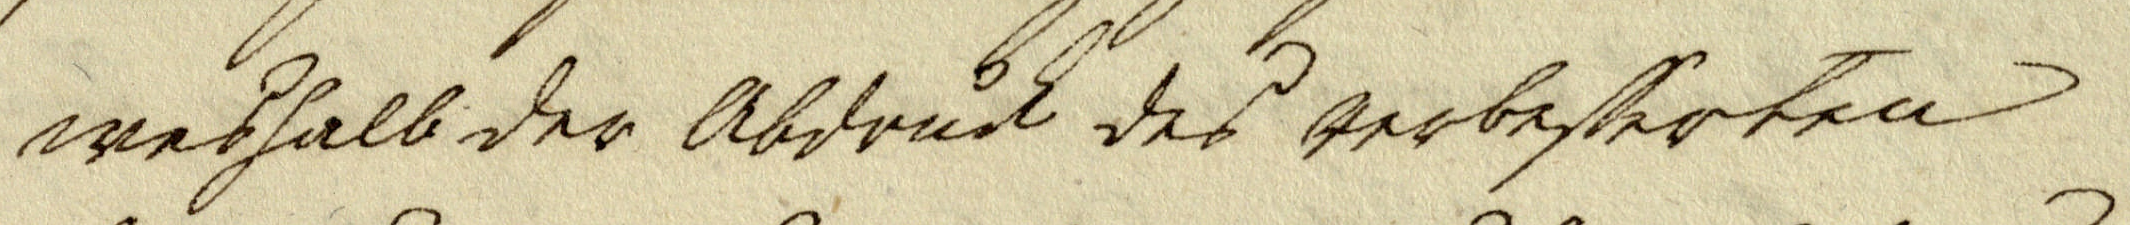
weshalb der Abdruck des verbesserten
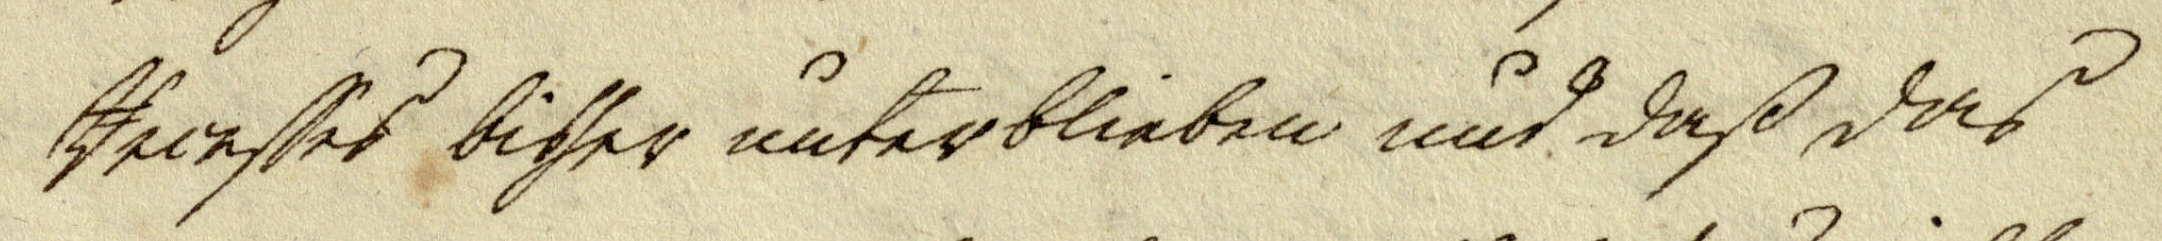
Recesses bisher unterblieben und daß das
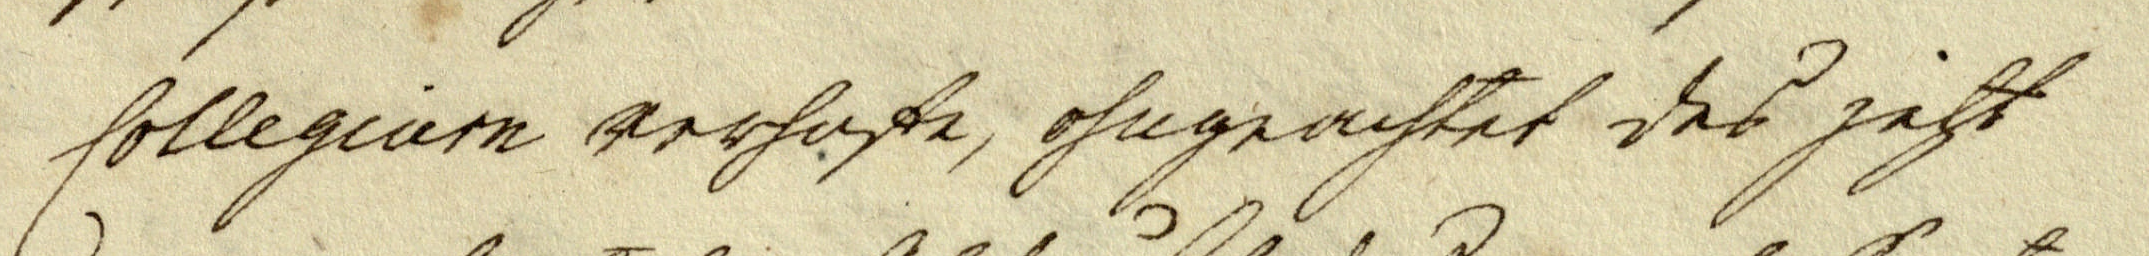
Collegium verhoffe, ohngeachtet des jetzt
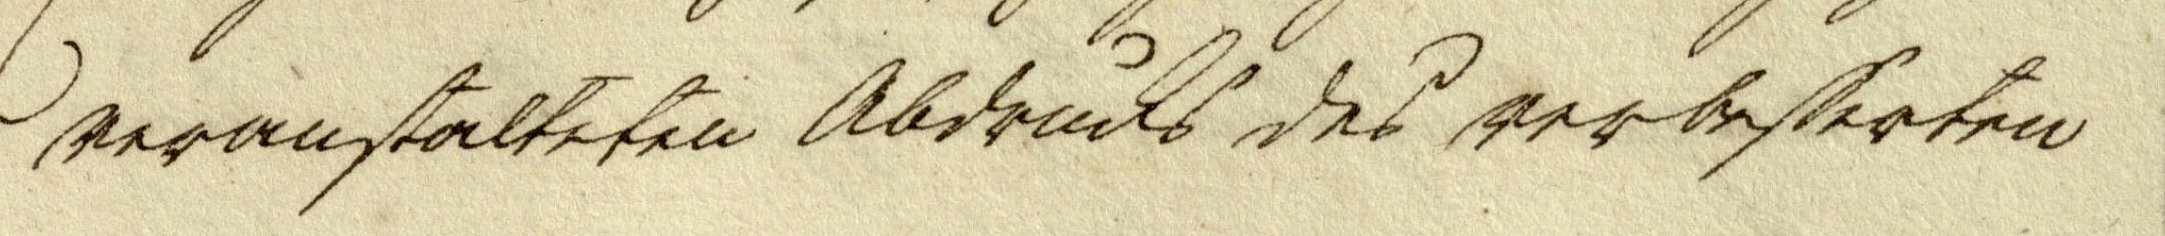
veranstalteten Abdrucks des verbesserten
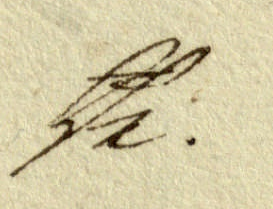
Re
